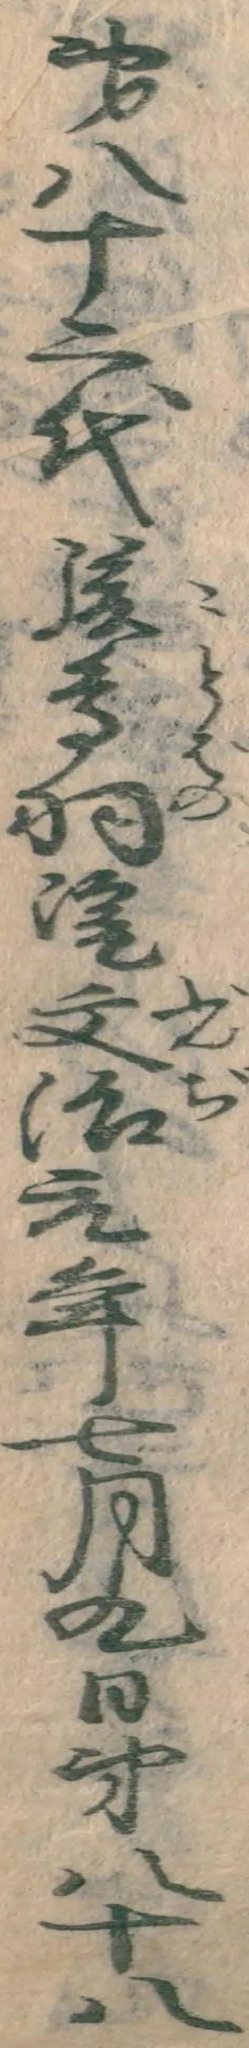第八十二代後鳥羽院文治元年七月九日第八十八

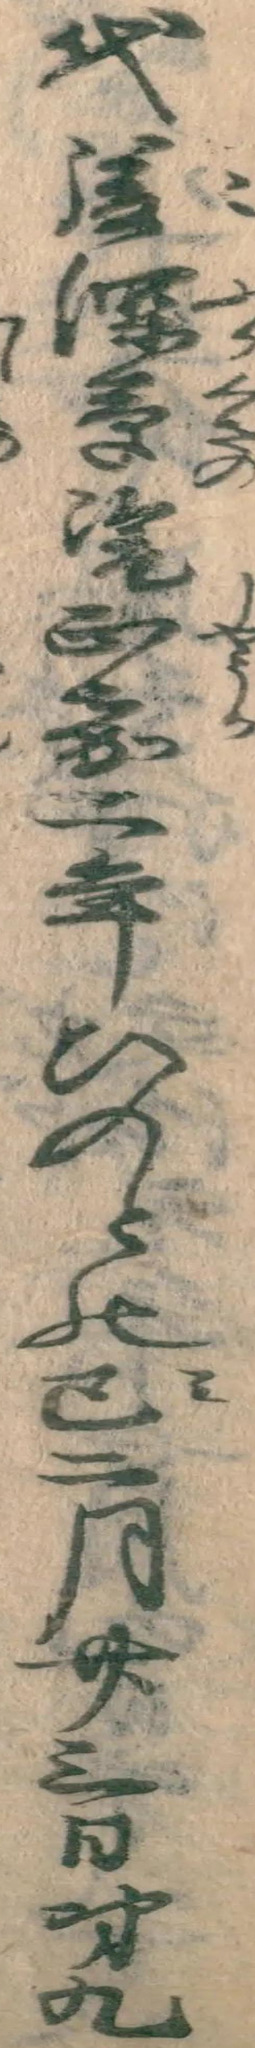代後深草院正嘉二年ひのとの巳二月二十三日第九
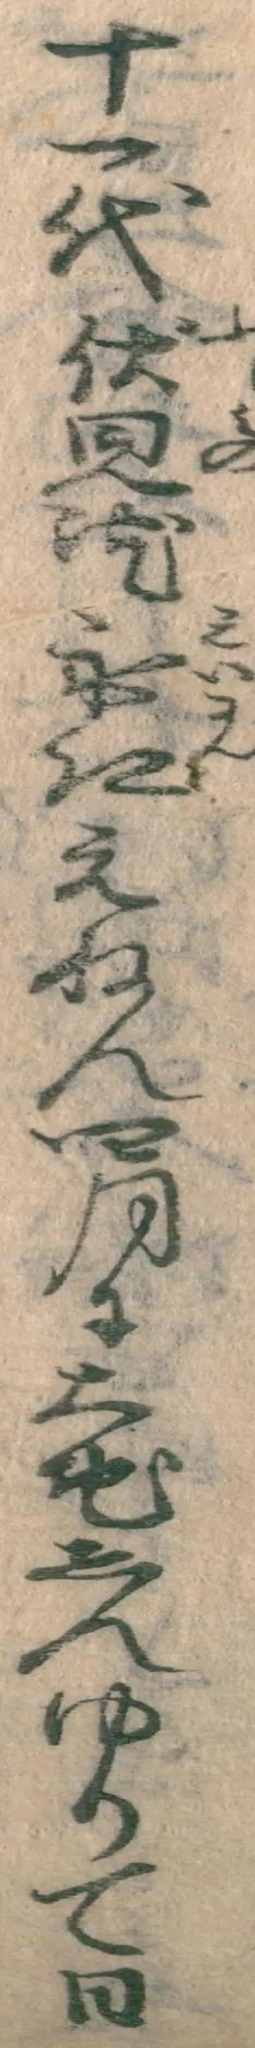十一代伏見院永仁元ねん四月に大地しんゆりて日
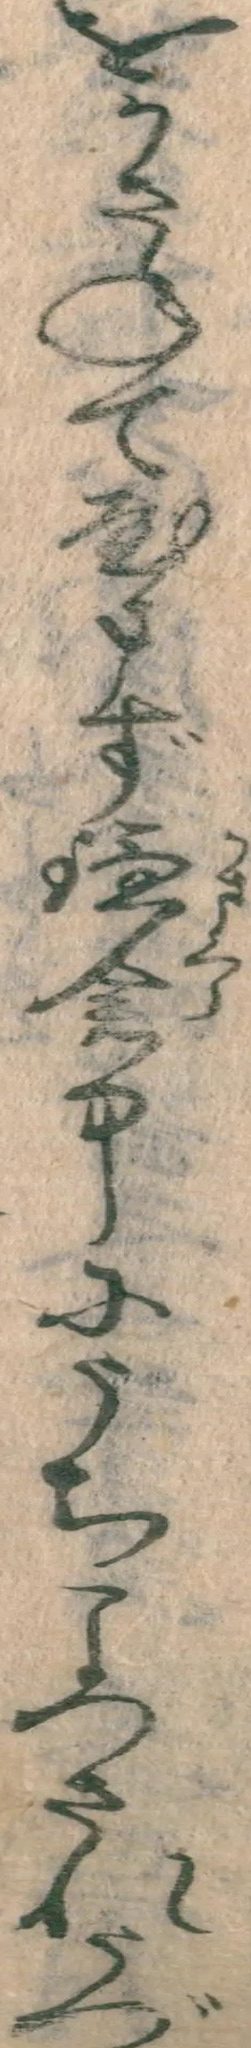をかさねてやまず鎌倉中にうちこはされうづ
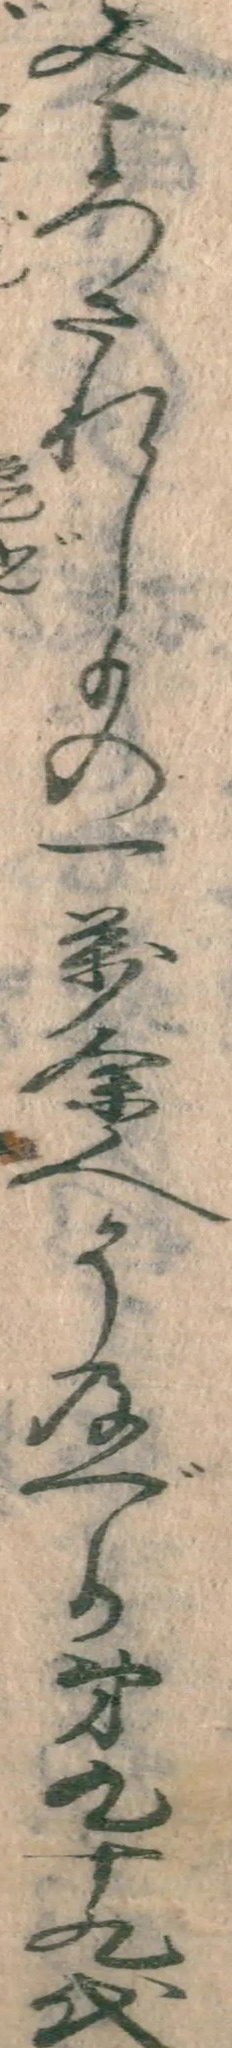みころされしもの一萬余人に及べり第九十九代
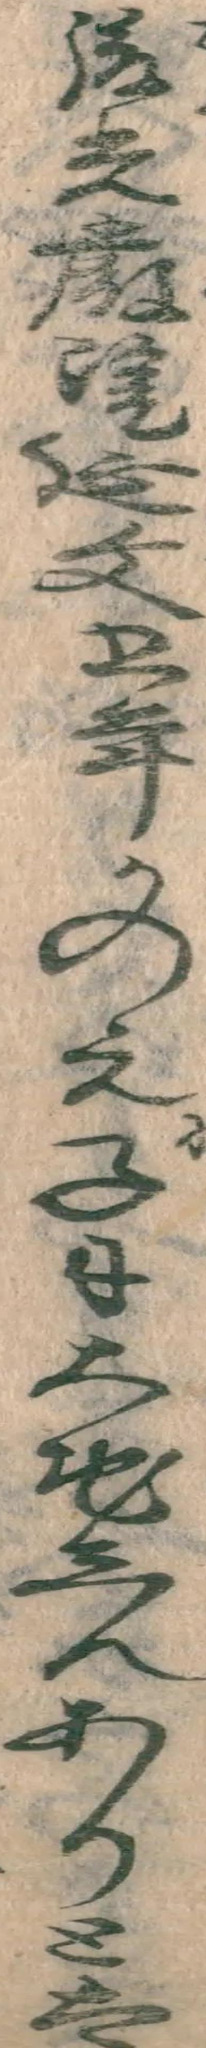後光厳院延文五年かのえ子に大地しんありと太
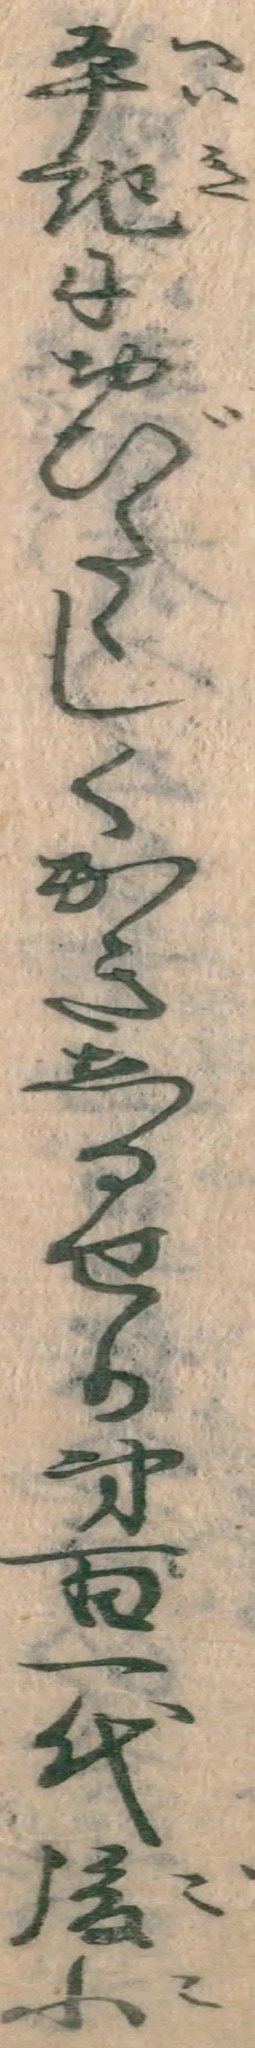平記におびたゝしくかきしるせり第百一代後小
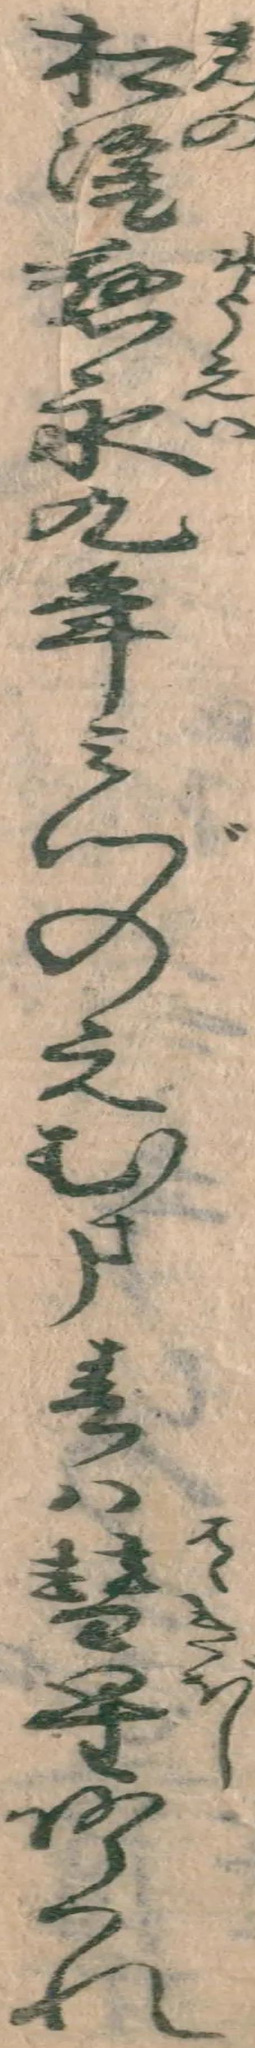松院應永九年みづのえむま春は彗星なかれ
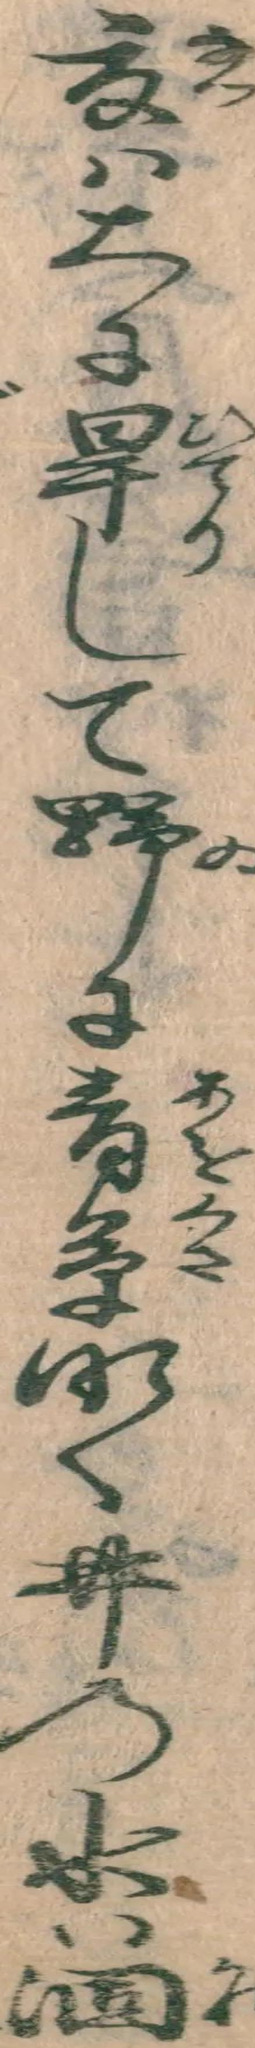夏は大に旱して野に青草なく井の水は涸
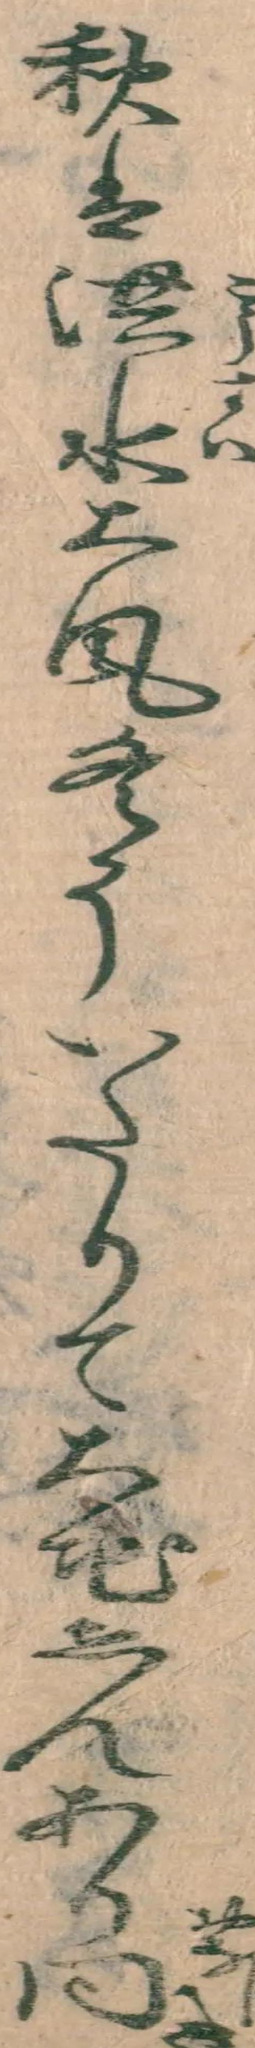秋は洪水大風冬にいたりて大地しんあり同
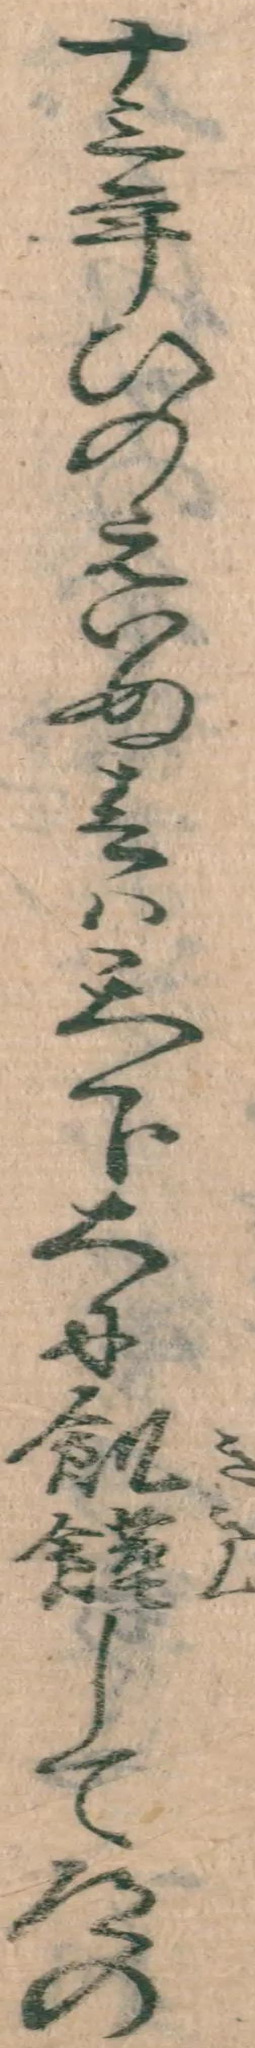十三年ひのえいぬ春は天下大に飢饉して道の
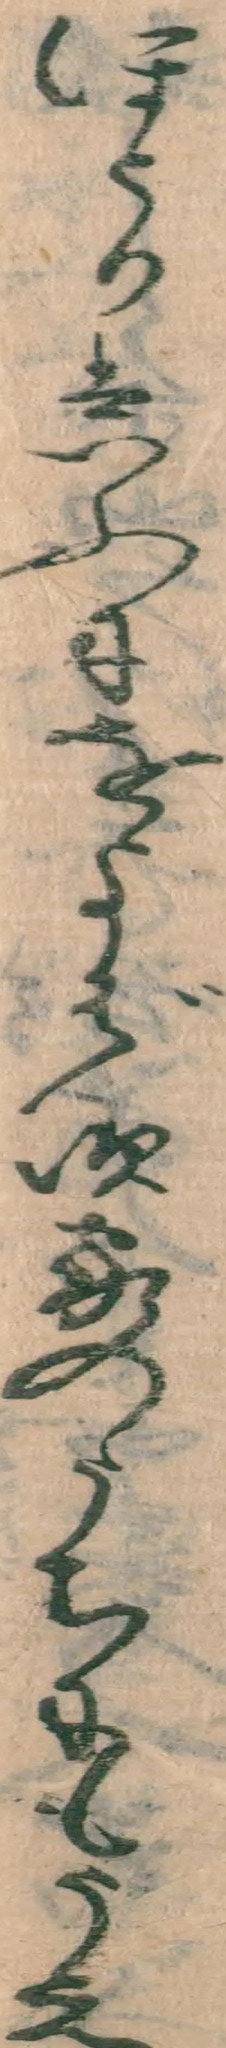ほとりはいふにをよばす家のうちにもうえ
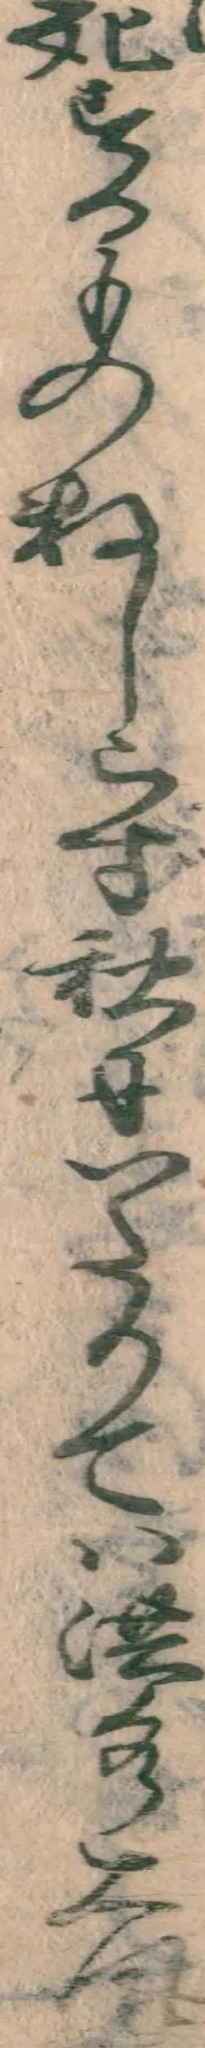死するもの数しらず秋にいたりては洪水大風
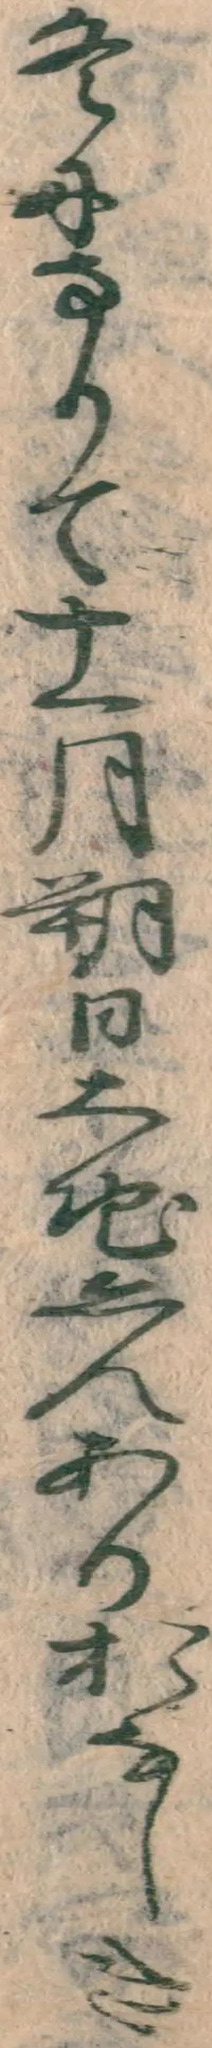冬になりて十一月朔日大地しんありおなしき
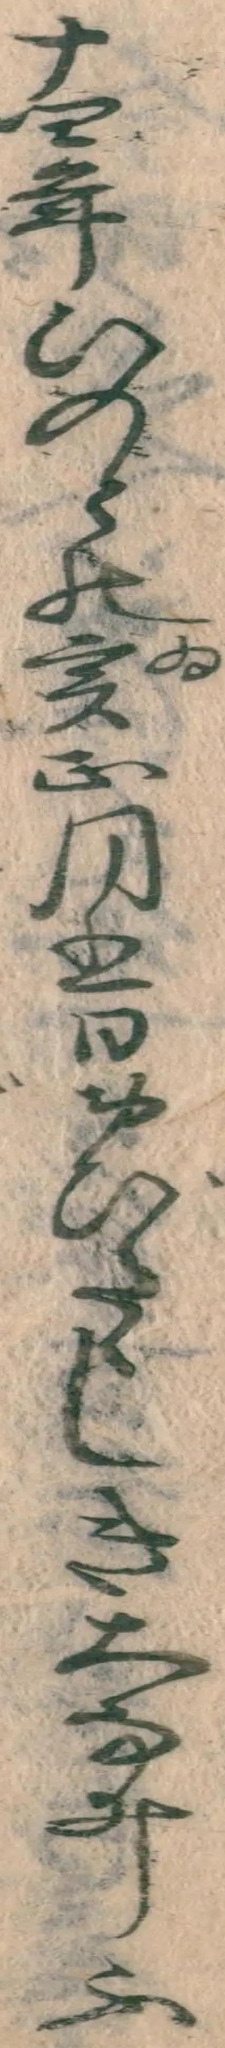十四年ひのとの亥正月五日おびたゝしき大なゐふ
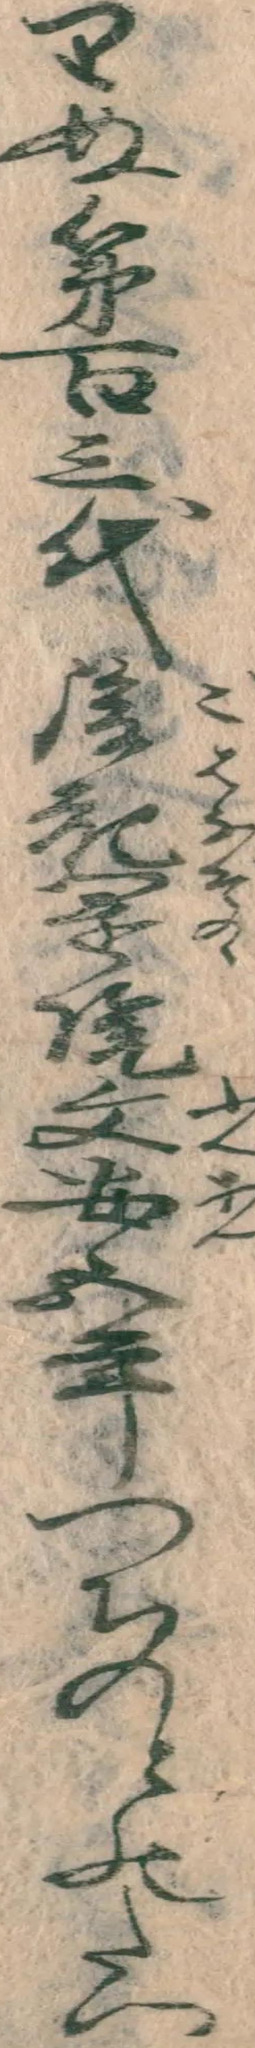りぬ第百三代後花園院文安五年つちのとのたつ
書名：艱難目異志. 上,下
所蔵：国立国会図書館 National Diet Library, JAPAN
